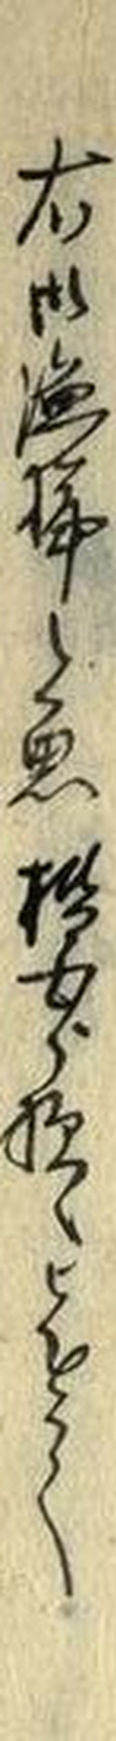右御漁猟之魚楷五郎様へ被進之
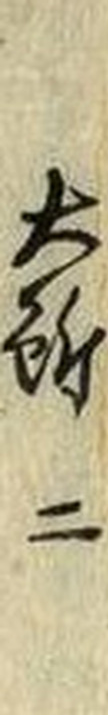大鮒二
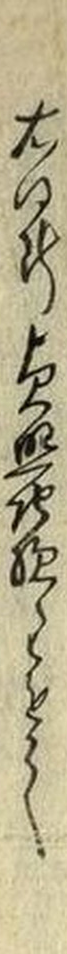右同断貞照院様へ被進之
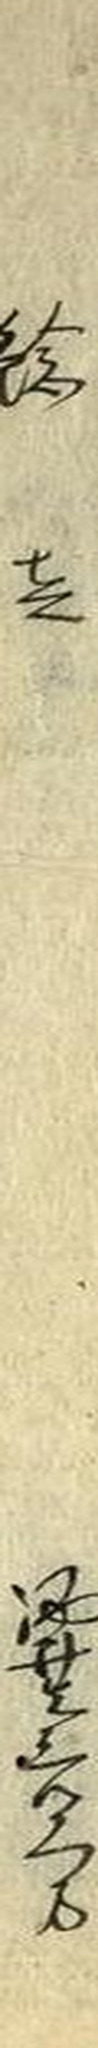鯰壱酒井与三左衛門方
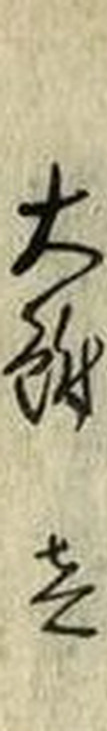大鮒二
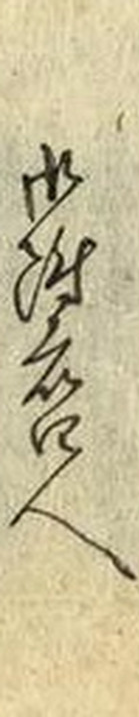御附衆四人
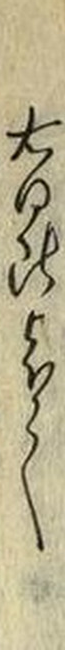右同断被下之
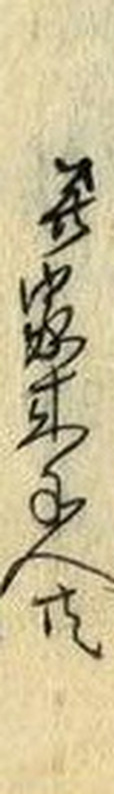并家来手人共
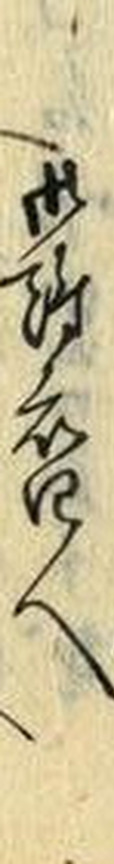御附衆四人
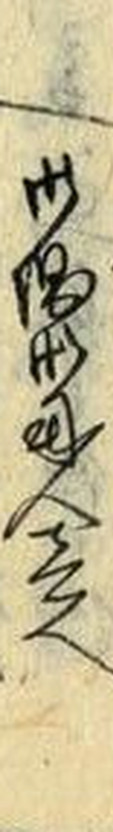御側御用人壱人
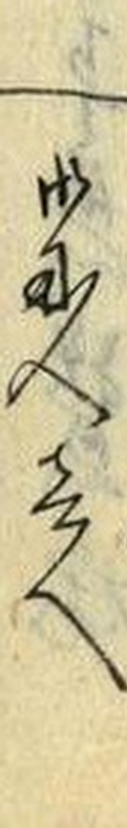御用人壱人
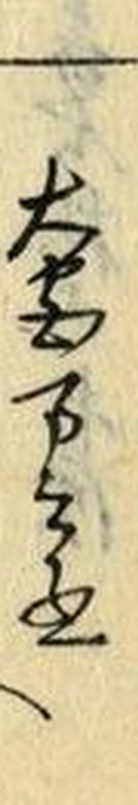大宮万之丞
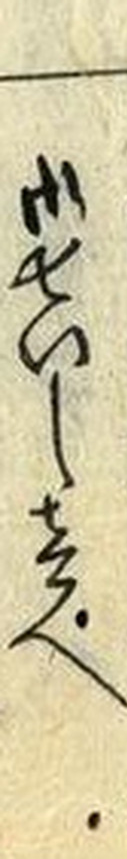御針いし壱人
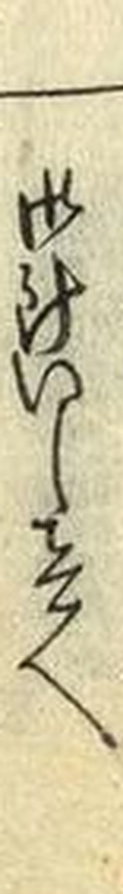御針いし壱人
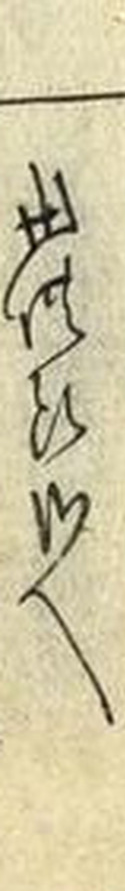御供頭弐人
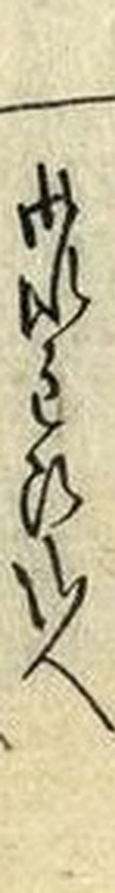御水主頭弐人
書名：少傅日録抄（斉善付側向頭取日記、江戸并道中、初入在国、逝去後…
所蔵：福井県文書館 Fukui Prefectural Archives
